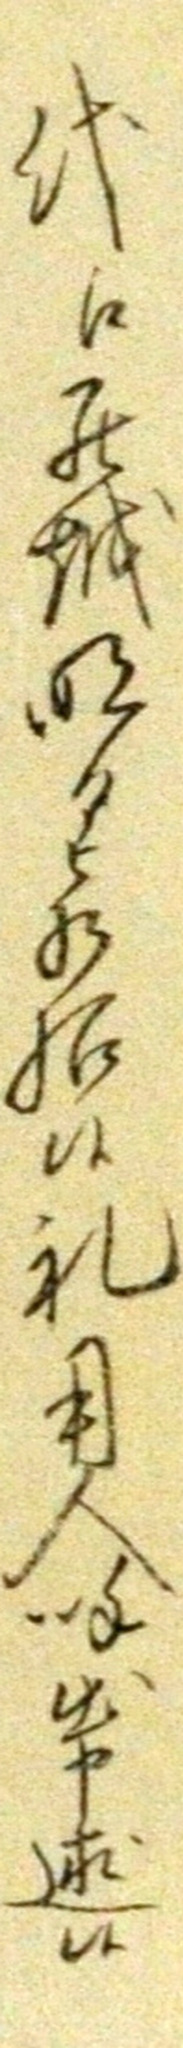代え罷越明日被相招候礼用人呼出申述候
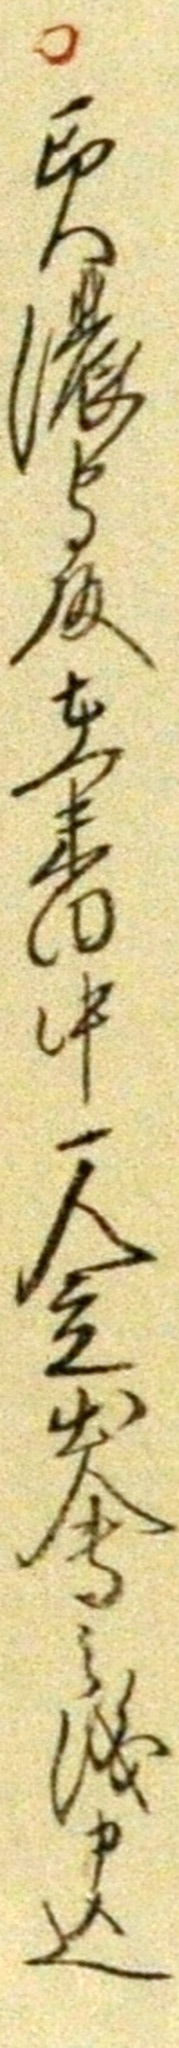美濃守殿在番中一人立出会之儀申込
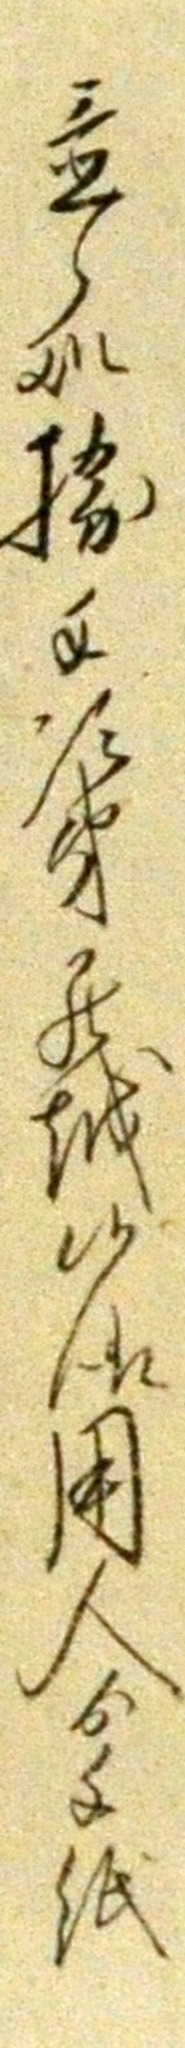置候処勝手次第罷越候様用人ゟ手紙
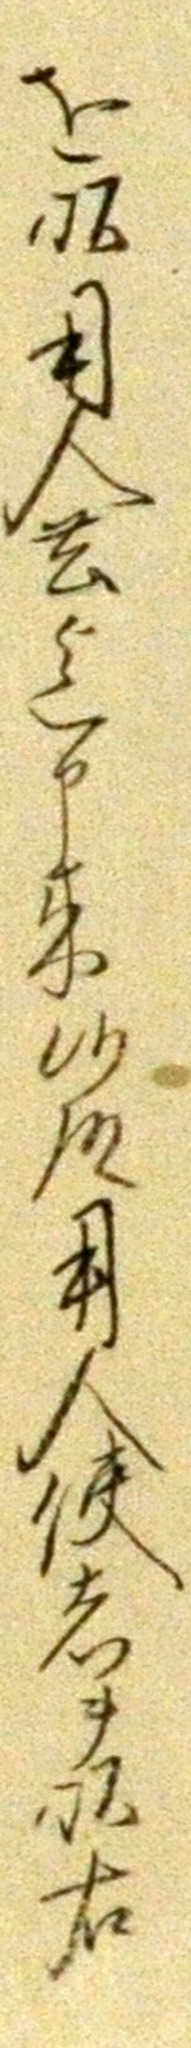を以用人共迄申来候故用人使者ヲ以右
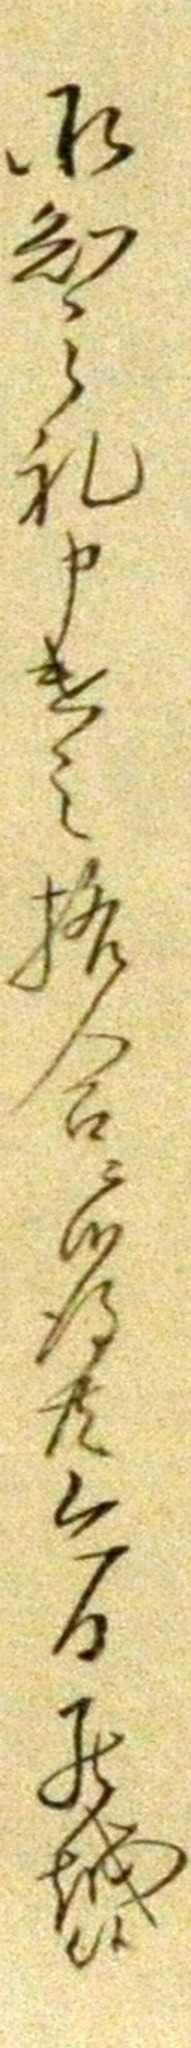承知之礼申遣之格合ニ候得共今日相越候
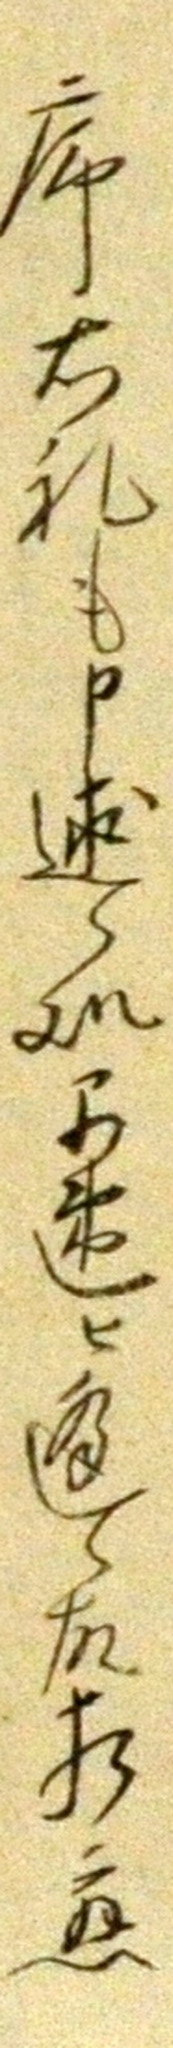席右礼も申述候処早速被逢候故相応
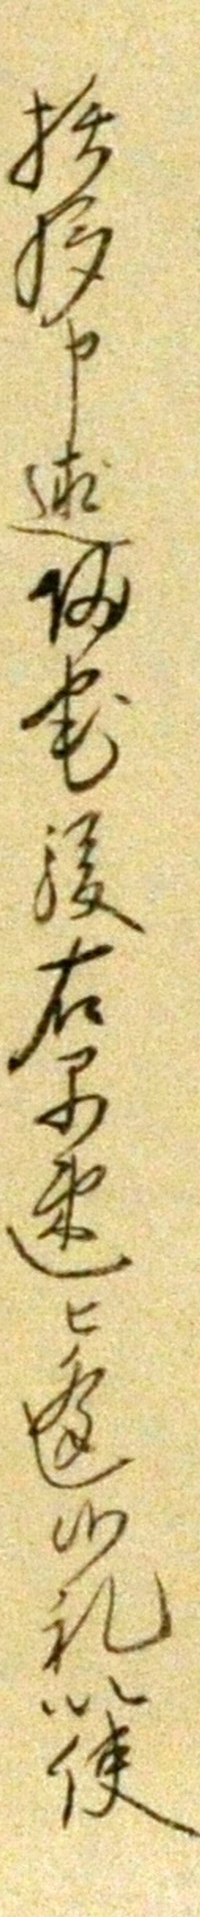挨拶申述帰宅後右早速被逢候礼以使
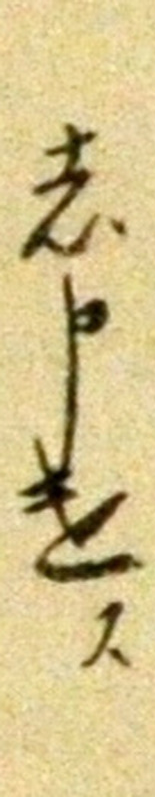者申遣ス
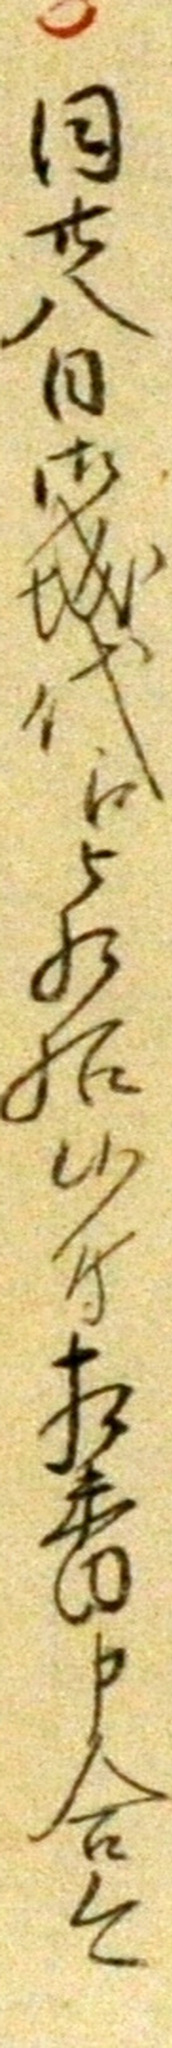同廿八日御城代え被相招候付相番申合今
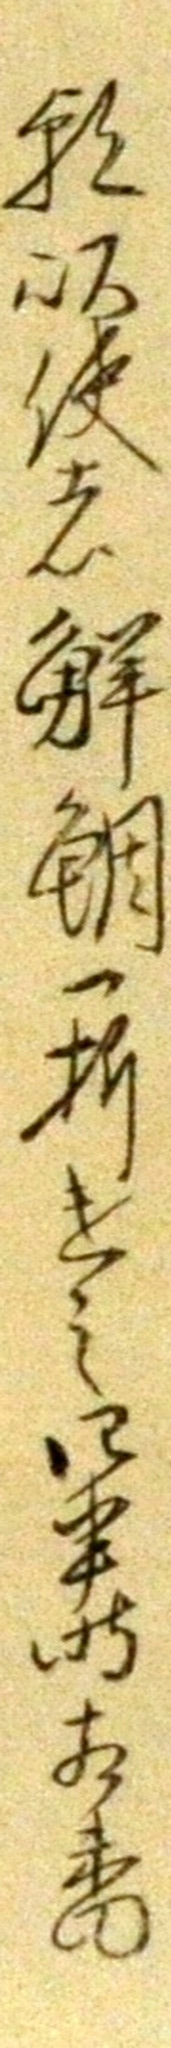朝以使者鮮鯛一折遣之四半時相番
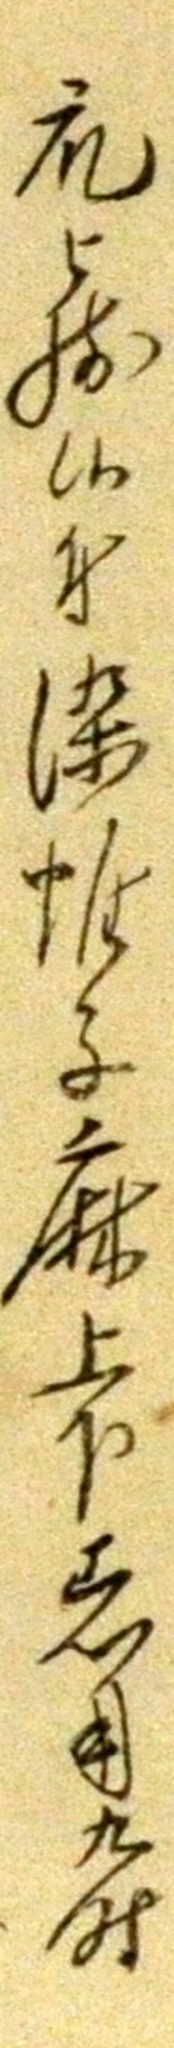衆被揃候付染帷子麻上下着用九時
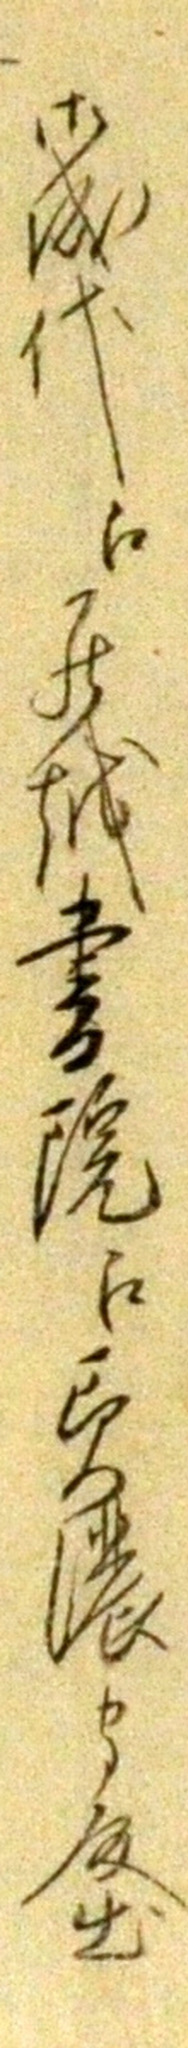御城代え罷越書院え美濃守殿出
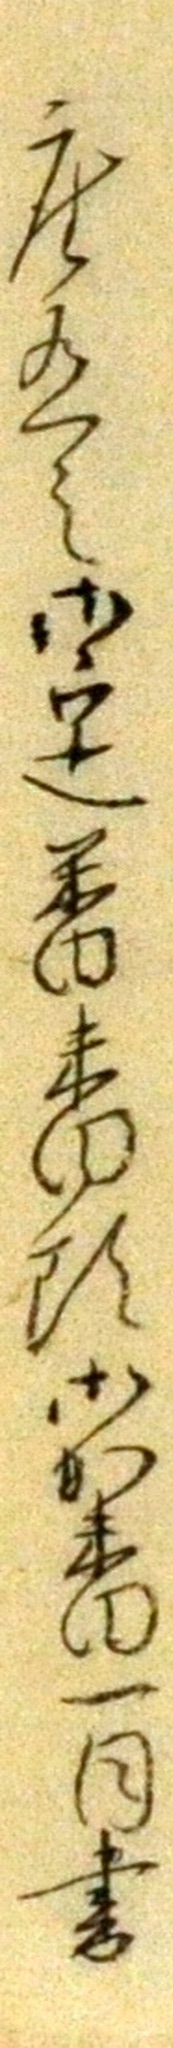座有之御定番番頭御加番一同書
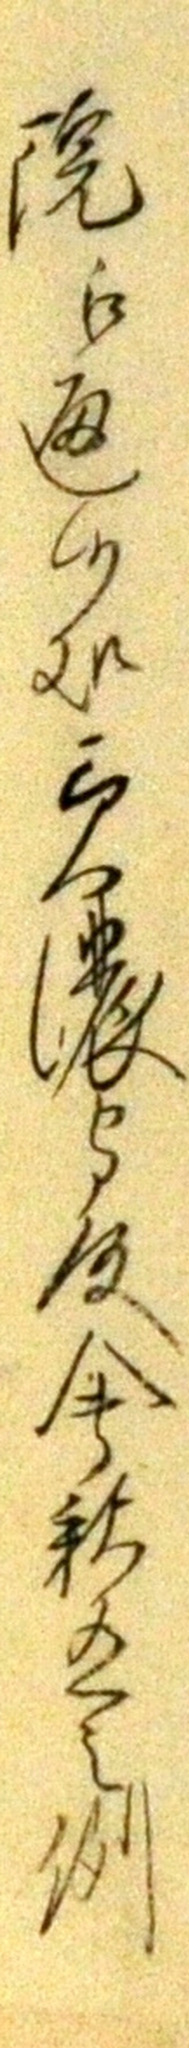院え通候処美濃守殿会釈有之例
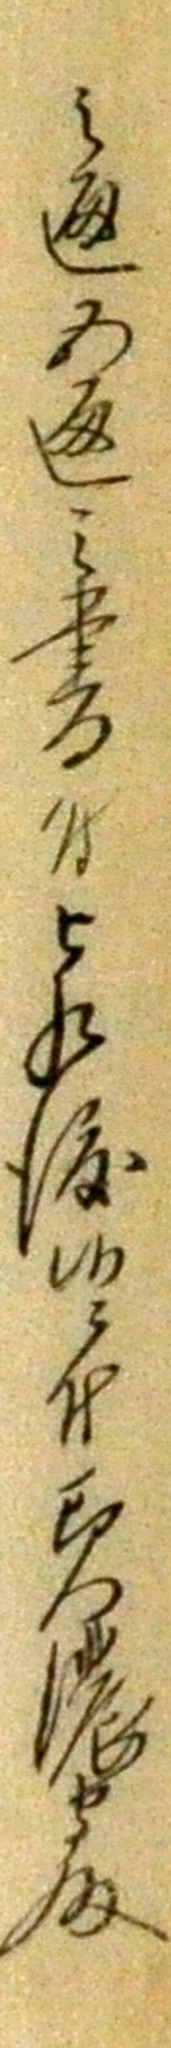之通五通之書付被相渡候二付美濃守殿
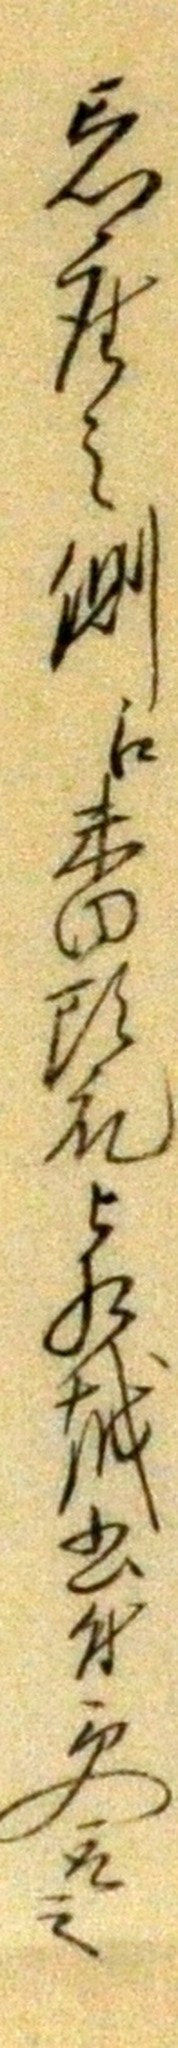着座之側え番頭衆被相越書付受取之
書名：大阪加番関係諸書留〔一括〕
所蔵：伊那市立高遠町図書館・合同会社AMANE
